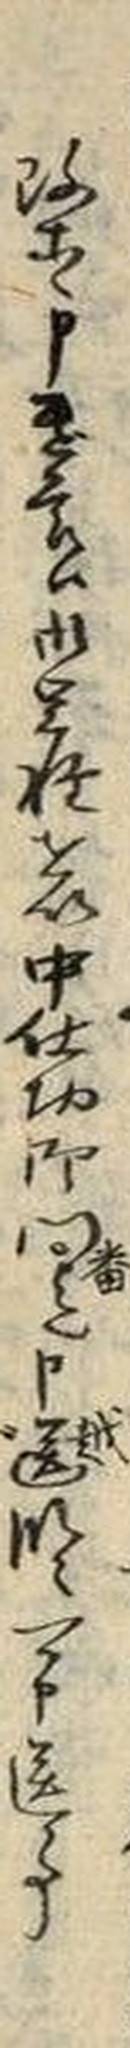改等へ申遣候節は御足軽を以中仕切御門番迄申越段々可申送事
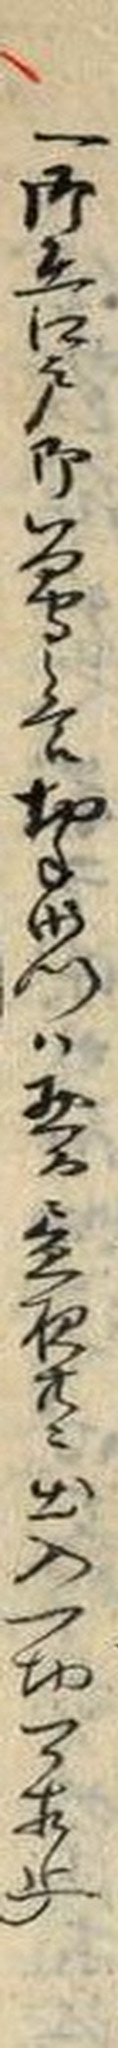一御在江戸御留守之節切手御門は惣而昼夜共に出入一切可相止

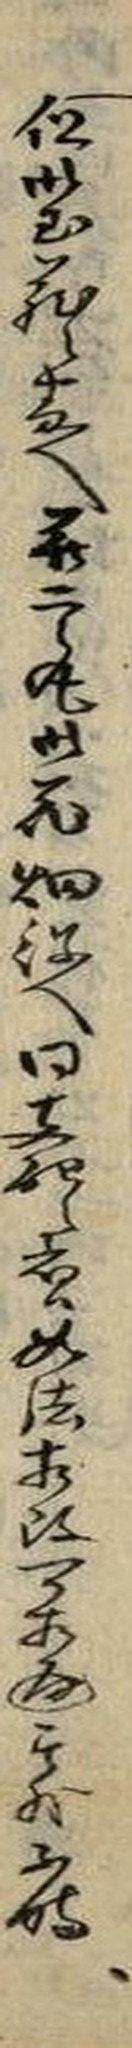但御玉蔵之番人并二之丸御花畑役人同支配之者は如法相改可相通其外不時
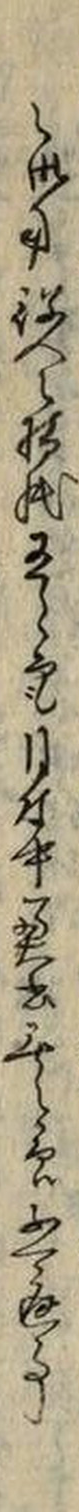之御用役人之指紙有之候而も目付中奥書無之候而は不可通候事
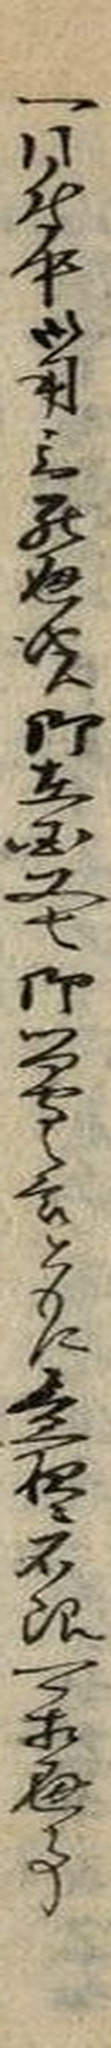一目付中御用に而罷通儀は御在国又は御留守之節ともに昼夜に不限可相通事
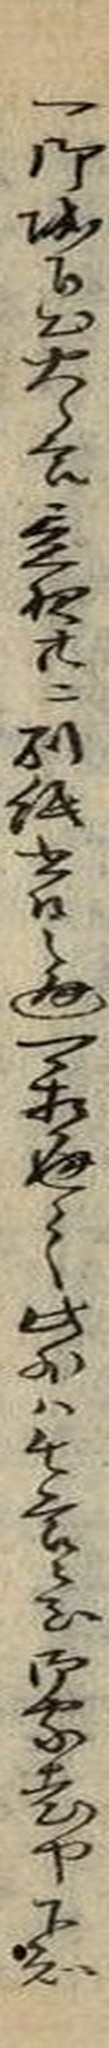一御城下出火之節昼夜共に別紙書付之通可相通之此外は其節に至御家老中下知
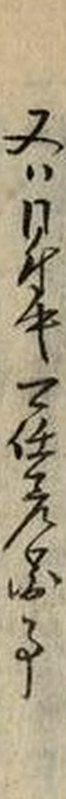又は目付中可任差図事
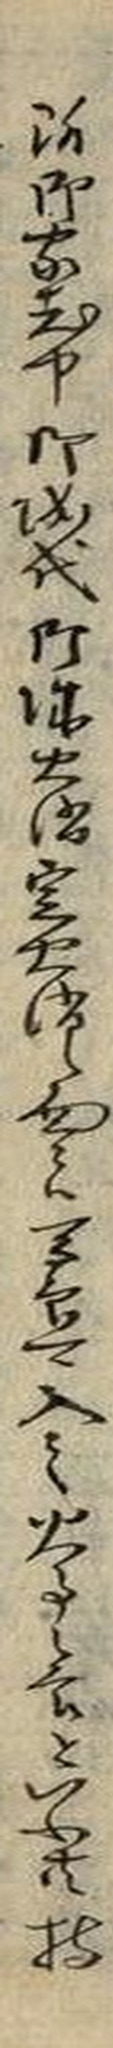附御家老中御城代御城火消定火消之面々は馬印可入之火事之節といふ共も持
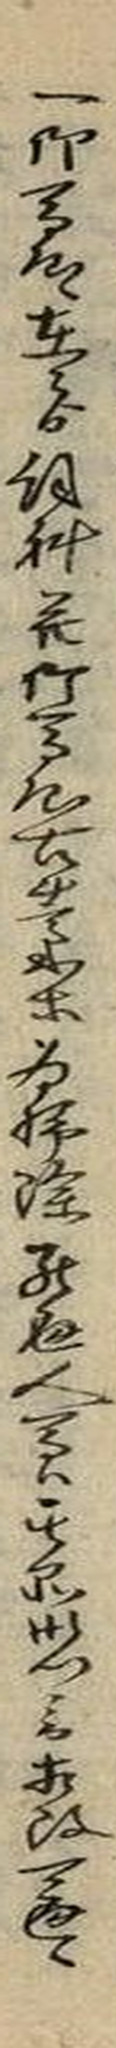一御馬屋へ在々ゟ飼料并御馬屋古藁等為掃除罷通人馬は其品御門に而相改可通候
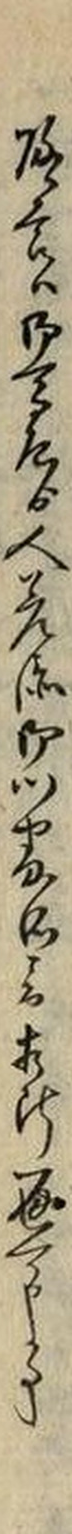帰候節は御馬屋ゟ人差添御門番所二而相断通可申事
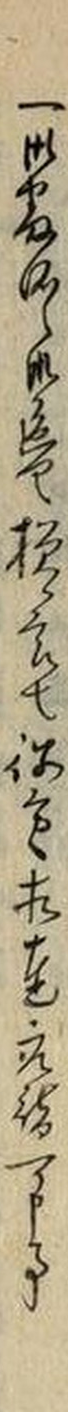一御番所之御道具損候節は役方へ相達取替可申候事
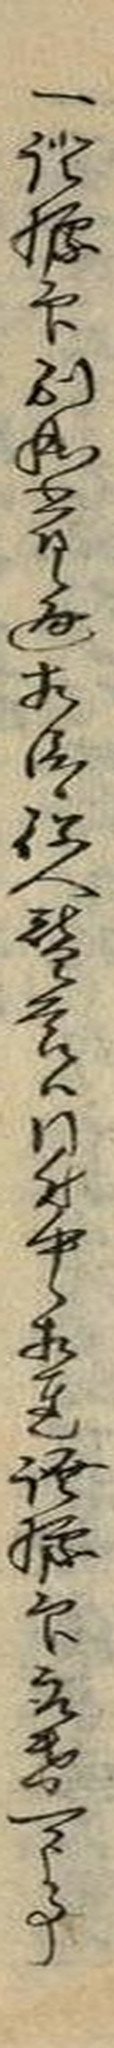一証拠印別紙書付之通相渡候役人替候節は目付中へ相達証拠印取替可申事
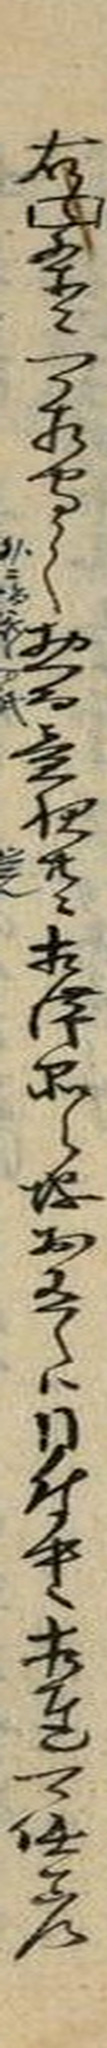右之条々可相守之惣而昼夜共に相滞候品之儀於有之は目付中へ相達可任差
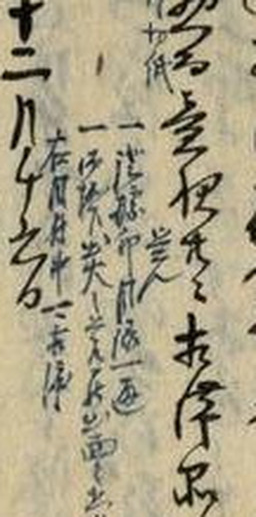一証拠印目録一通
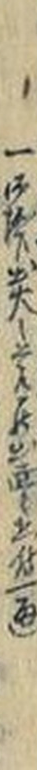一御城下出火之節罷出面々書付一通
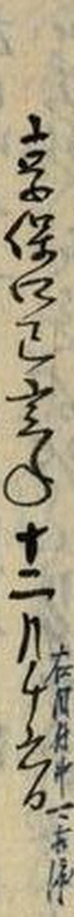享保四己亥年十二月十六日
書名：御門御櫓之部
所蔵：福井県文書館 Fukui Prefectural Archives
